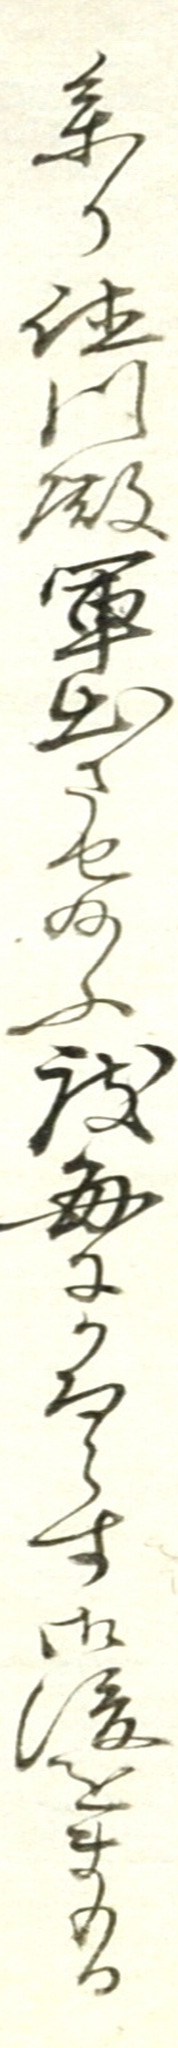参り徳川殿軍出させ給ふ度毎にかならす御後をまもる
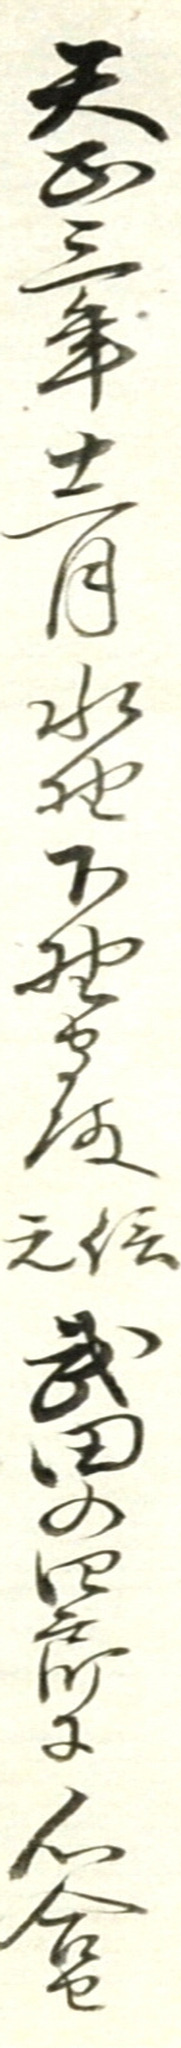天正三年十二月水野下野守殿信元武田の四郎に心合せ
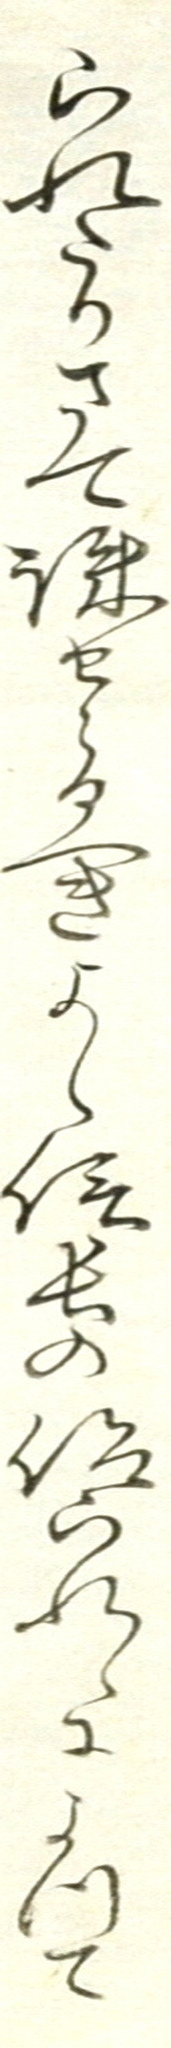られたりさて誅せらるへきよし信長の仰られしによつて
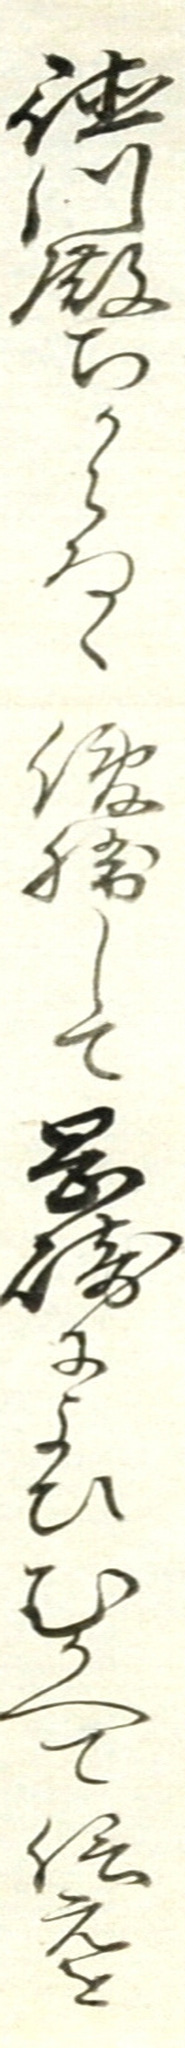徳川殿ちからなく俊勝して岡崎によひむかへて信元を
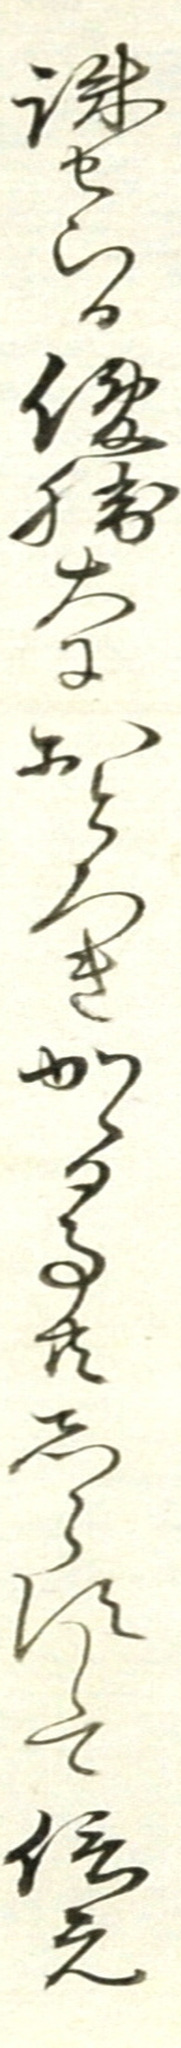誅せらる俊勝大におとろきかる事共しらすして信元
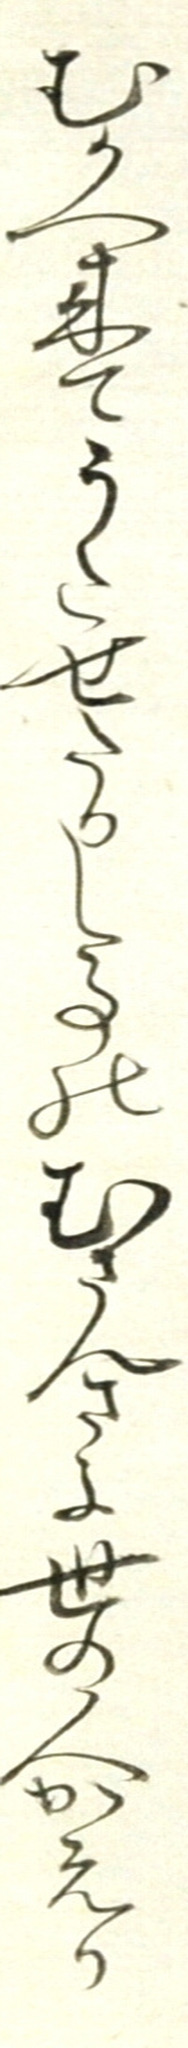むかへ来てうたせたりし事のむさんさよ世の人かえり
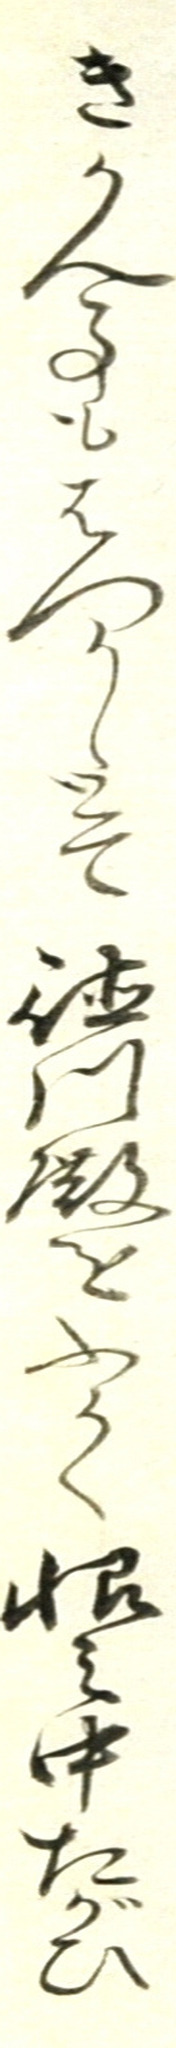きかん事もはつかしとて徳川殿をふかく恨み中たがひ

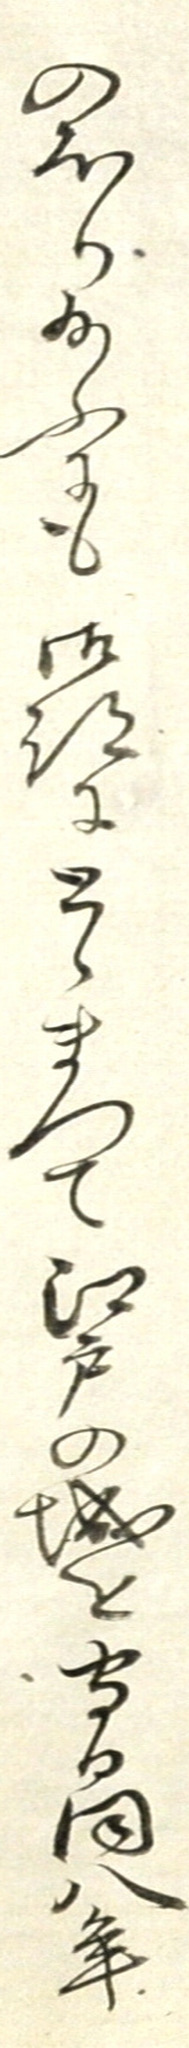のほり給ふにも御跡にとゝまつて江戸の城を守る同八年
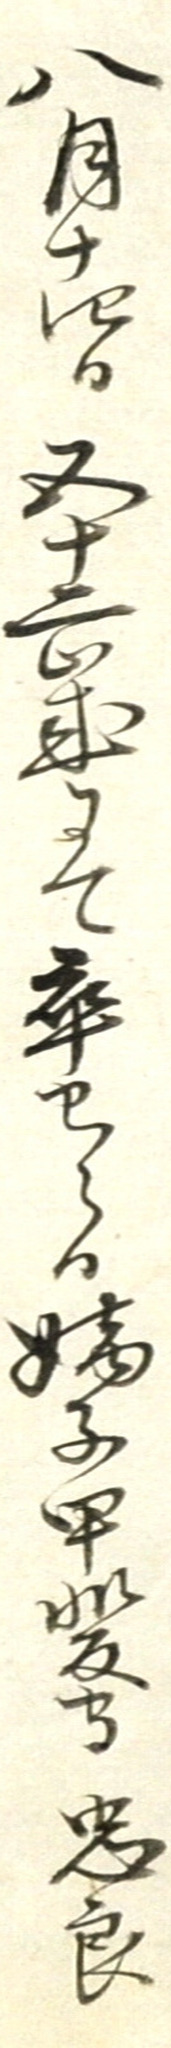八月十四日五十二歳にて卒せらる嫡子甲斐守忠良
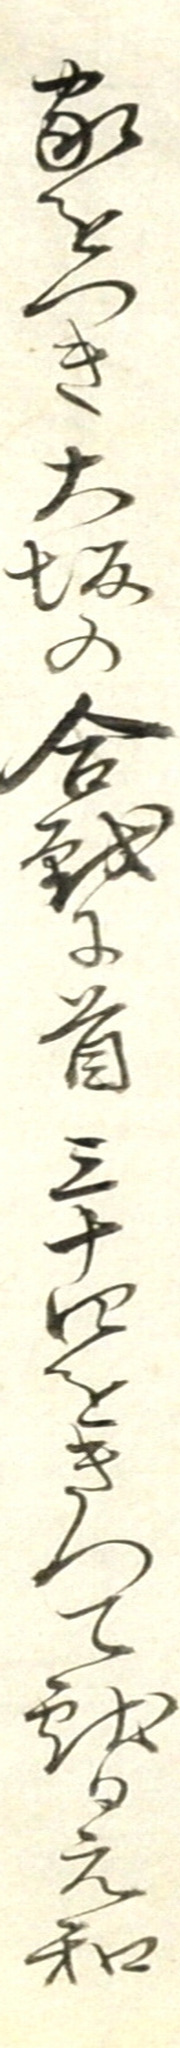家をつき大坂の合戦に首三十四をきつて献る元和
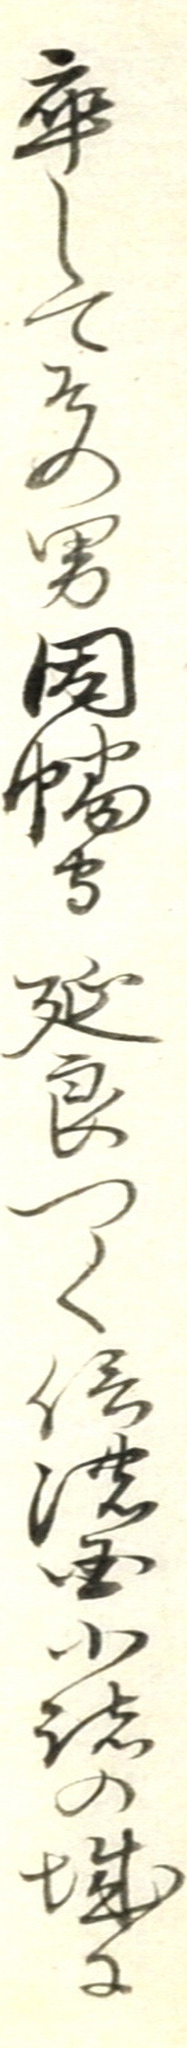卒してその男因幡守延良つく信濃国小諸の城に
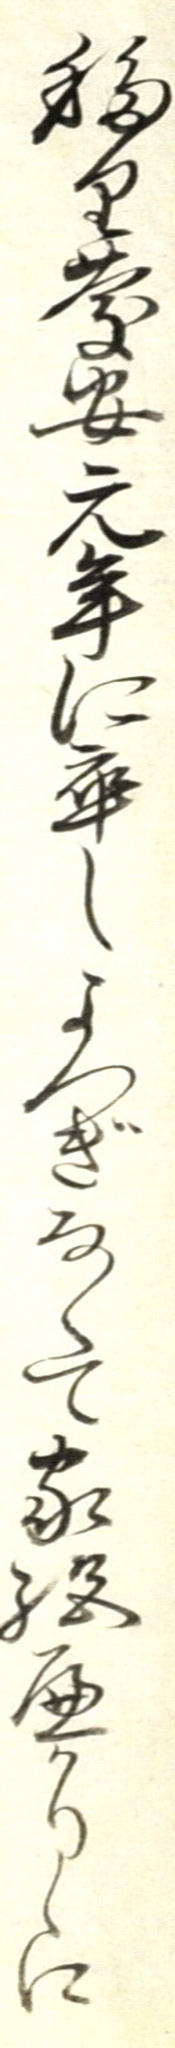移り慶安元年に卒しよつぎなくて家絶へけりしに
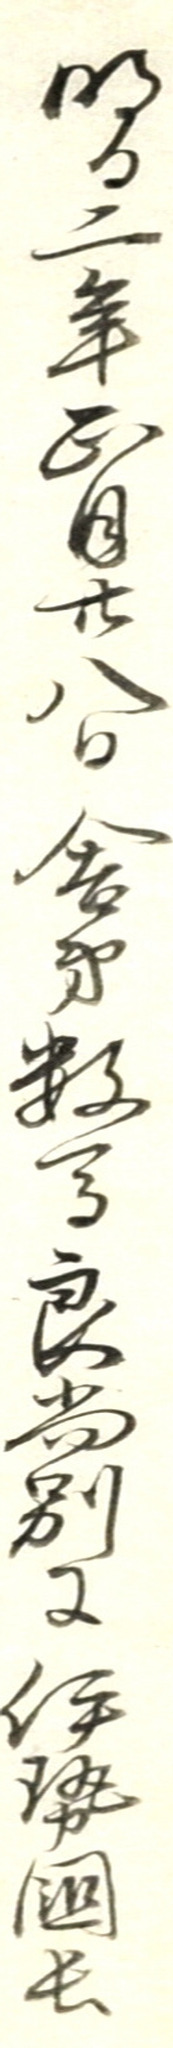明る二年正月廿八日舎弟数馬良尚別に伊勢国長
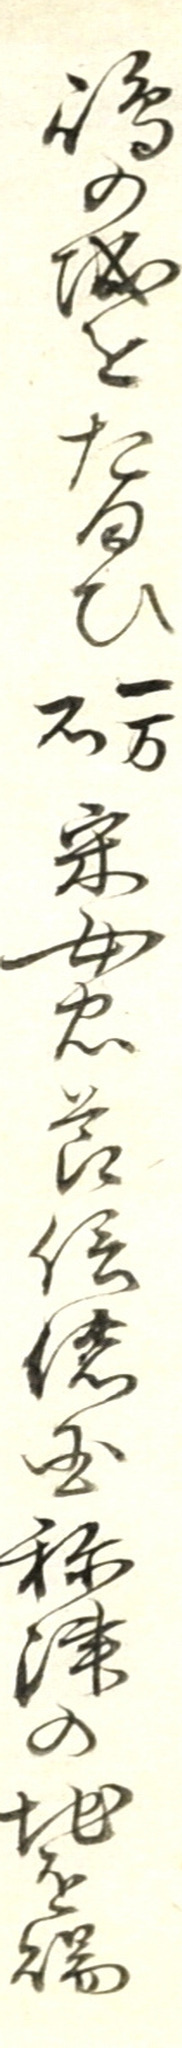島の城をたまひ一万石宗女忠節信濃国祢津の地を賜
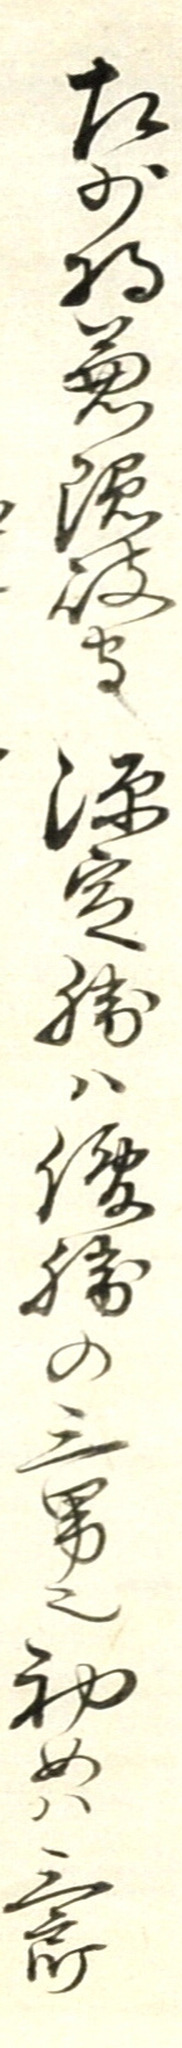左少将兼隠岐守源定勝は俊勝の三男也初めは三郎
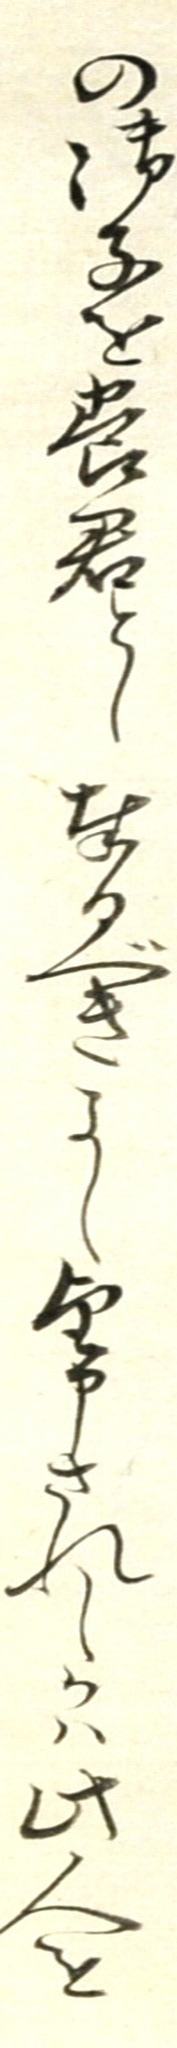の御子を養君とし奉るべきよし望申されしかは此人を
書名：藩翰譜（二・三）
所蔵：伊那市立高遠町図書館・合同会社AMANE
